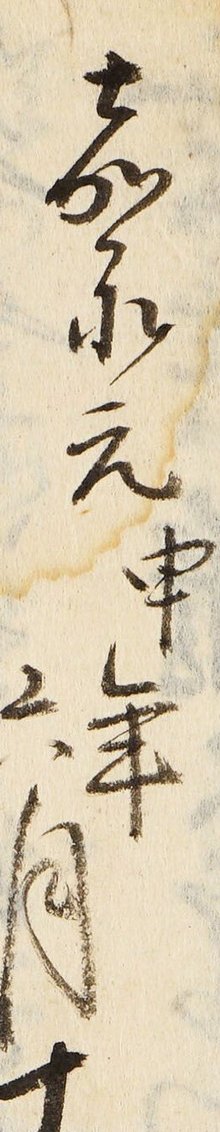嘉永元申年
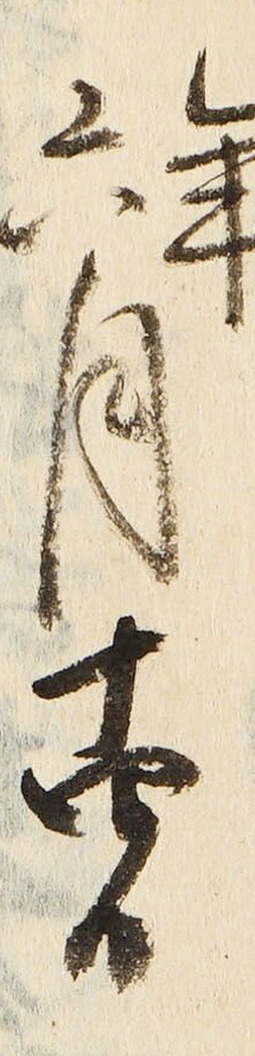六月十四日
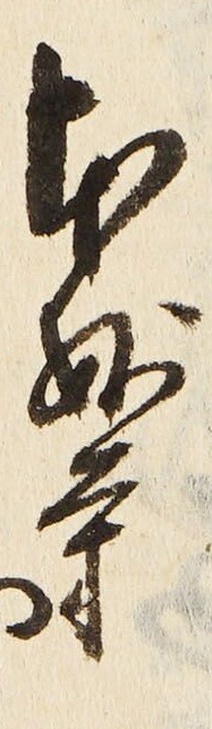本妙寺
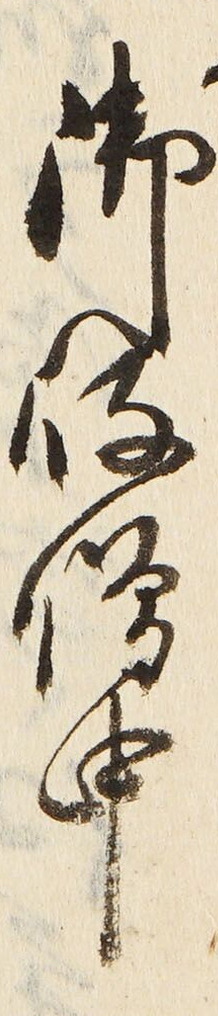御役僧中
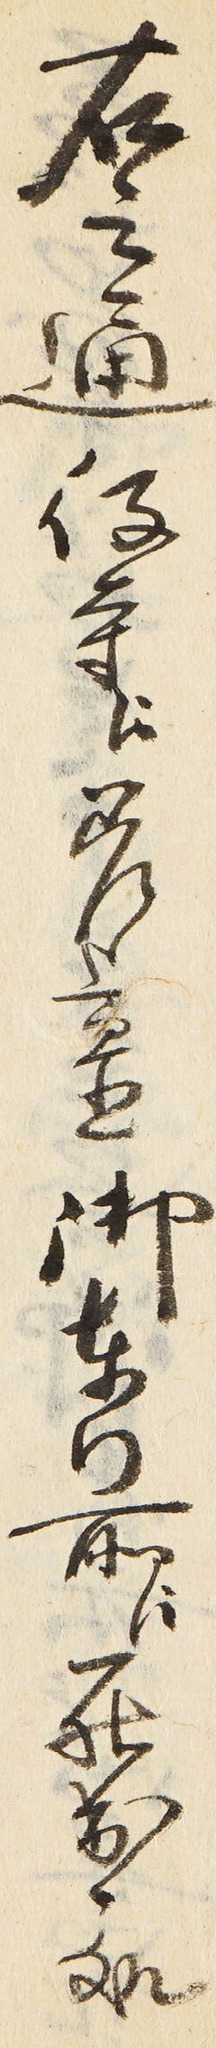右之通役寺江差上置御奉行所江罷出候処
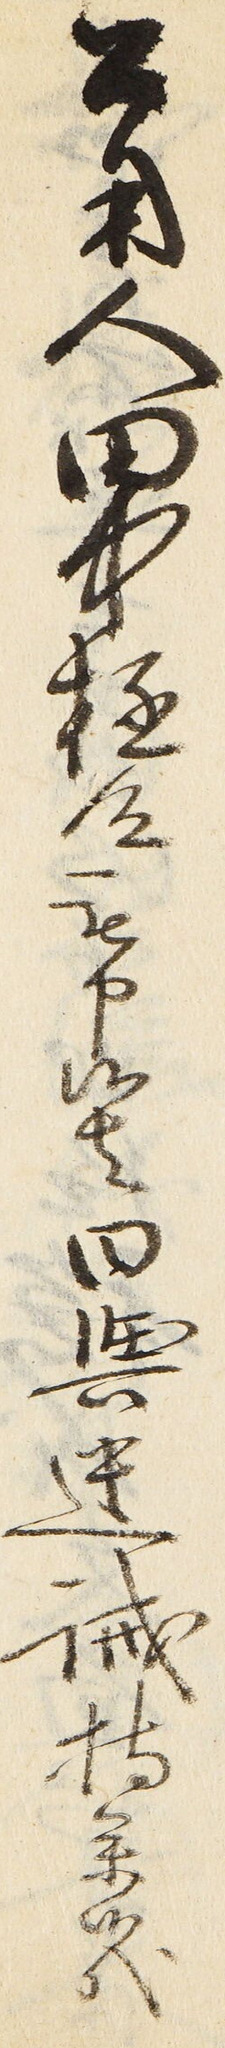公用人田中極道被申候は日興遺誡持参候哉
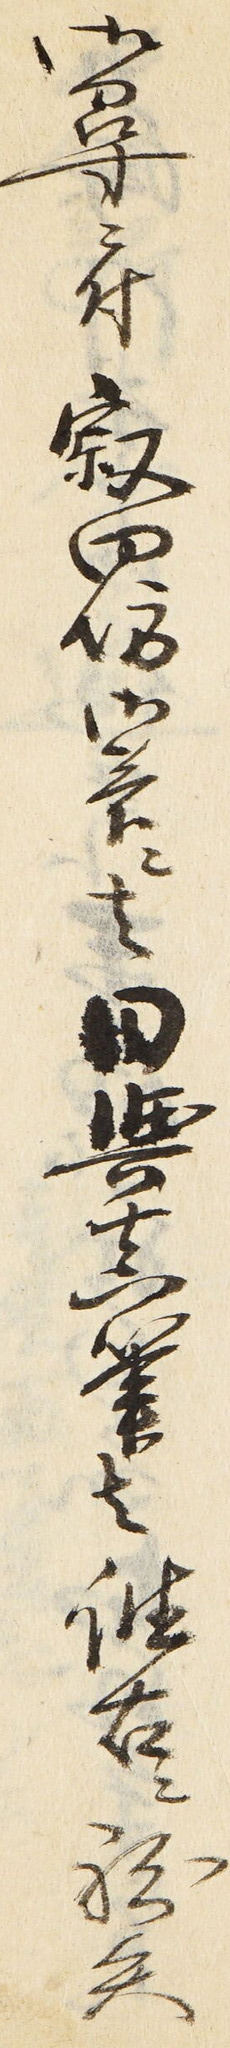御尋に付寂日坊御答には日興真筆は往古に紛失
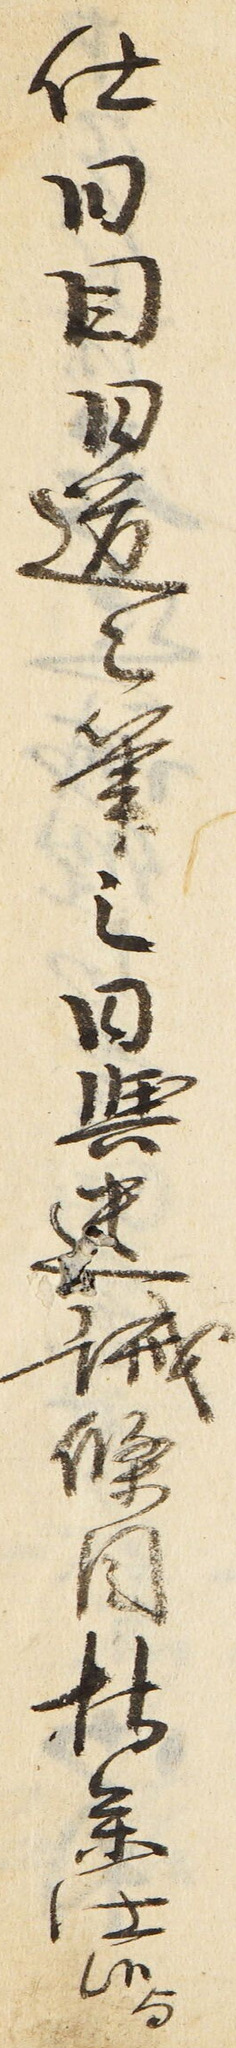仕日目日道之筆之日興遺誡條目持参仕候と

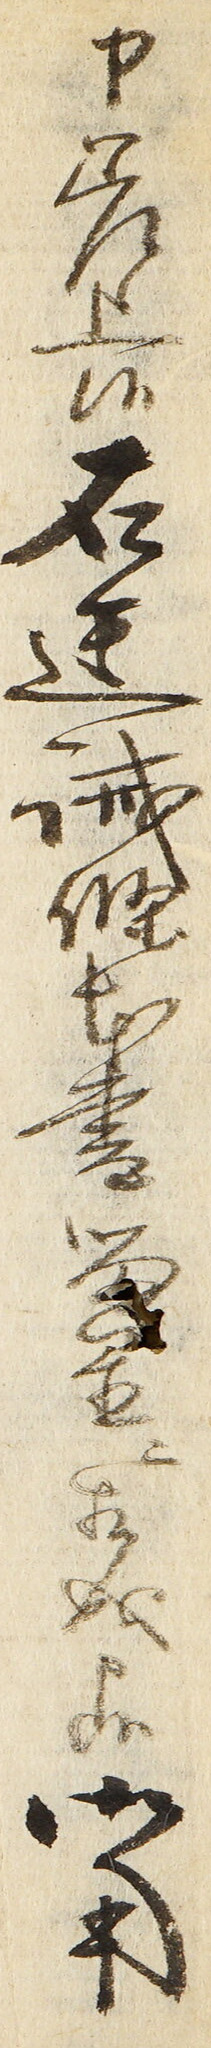申差上候右遺誡條本書留置に相成申候御用
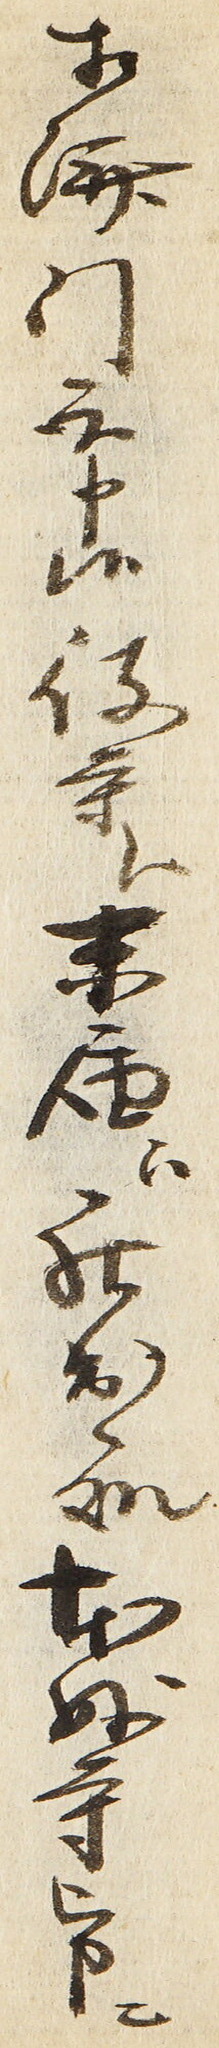相済引取申候役寺江末届江罷出候処本妙寺被申に
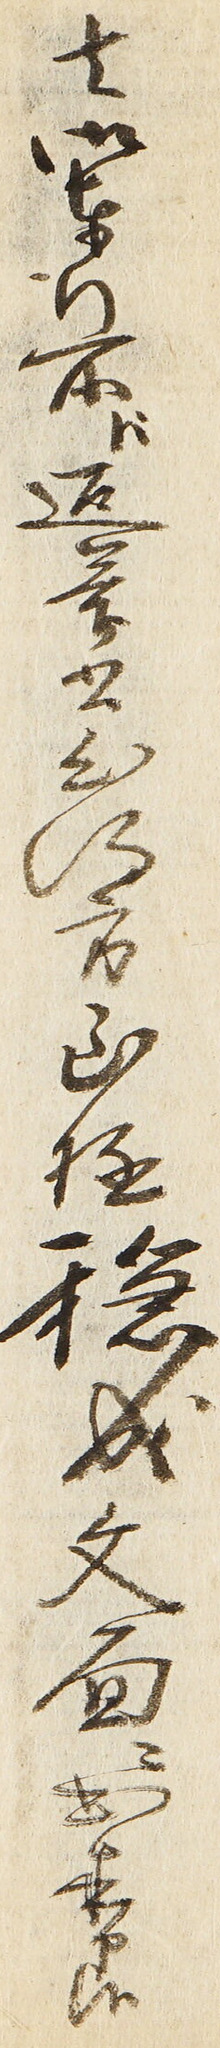は御奉行所江返答書心得方至極穏成文面に出来申候
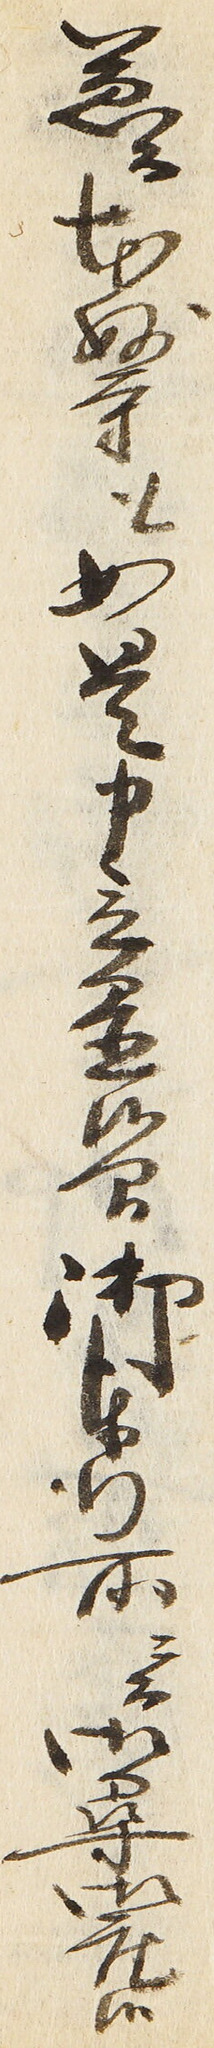兼而本妙寺も如是申立置候間御奉行所に而御尋御座候
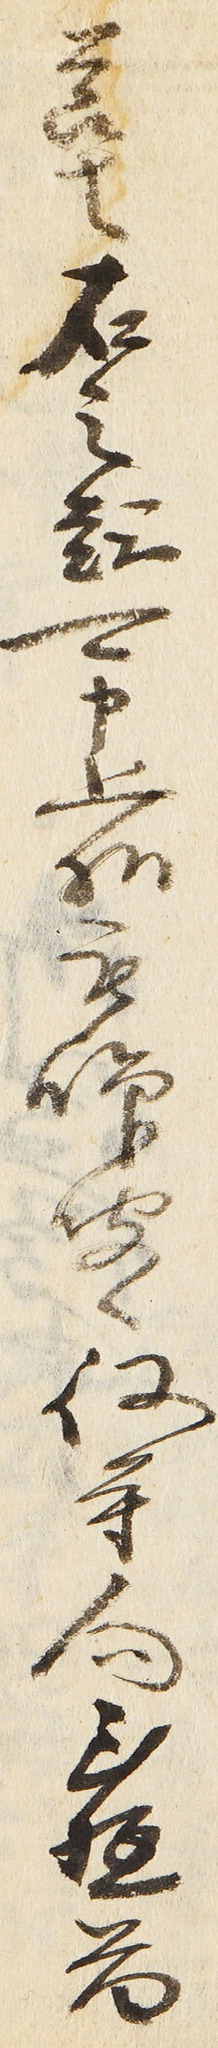節は右之趣可申上様被仰聞候役寺向至極首
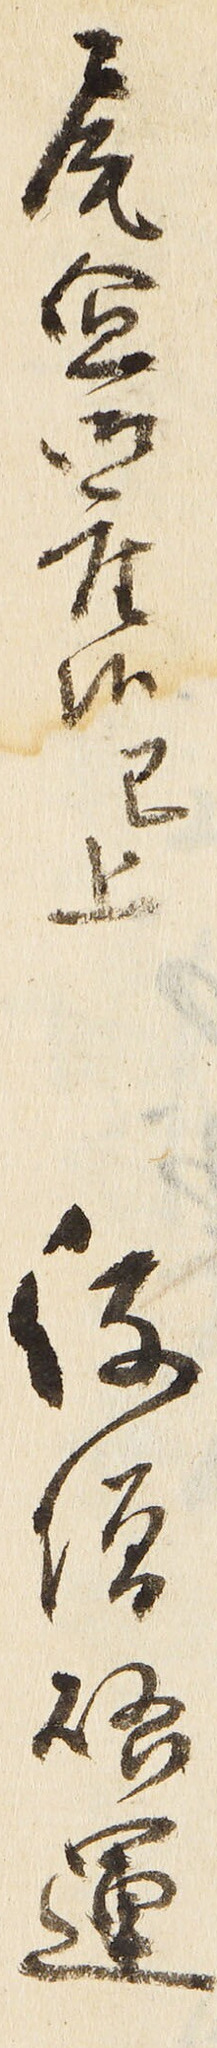尾宣御座候已上役僧啓運
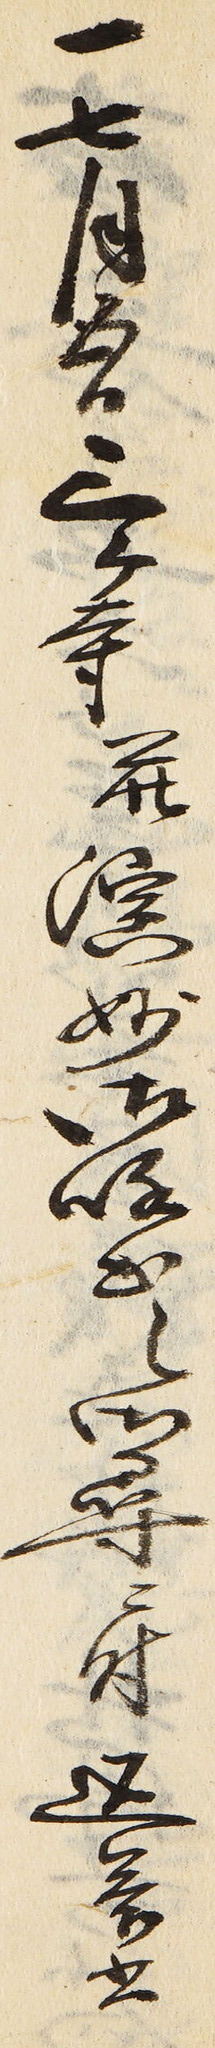一七月五日三ケ寺并演妙御呼出し御尋に付返答書
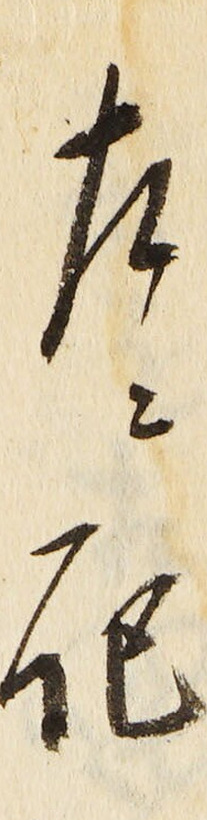左に記
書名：異流一件日記
